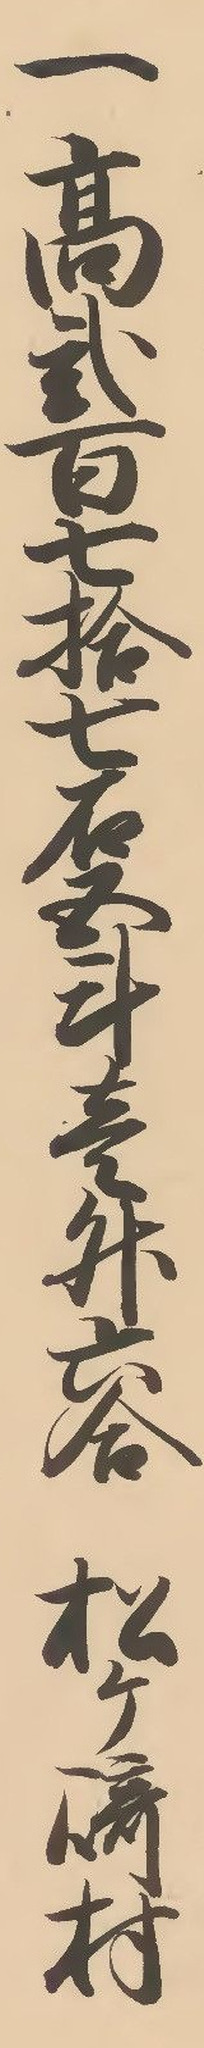一高弐百七拾七石五斗壱升六合松ヶ崎村
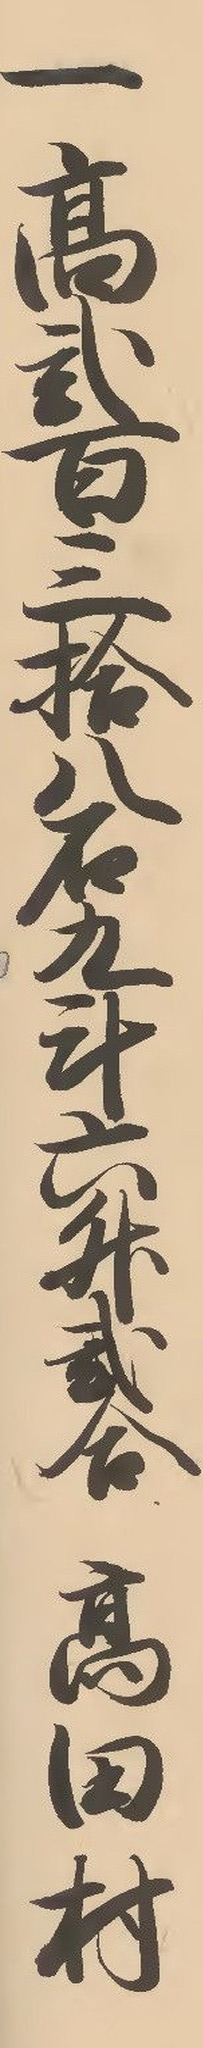一高弐百三拾八石九斗六升弐合高田村
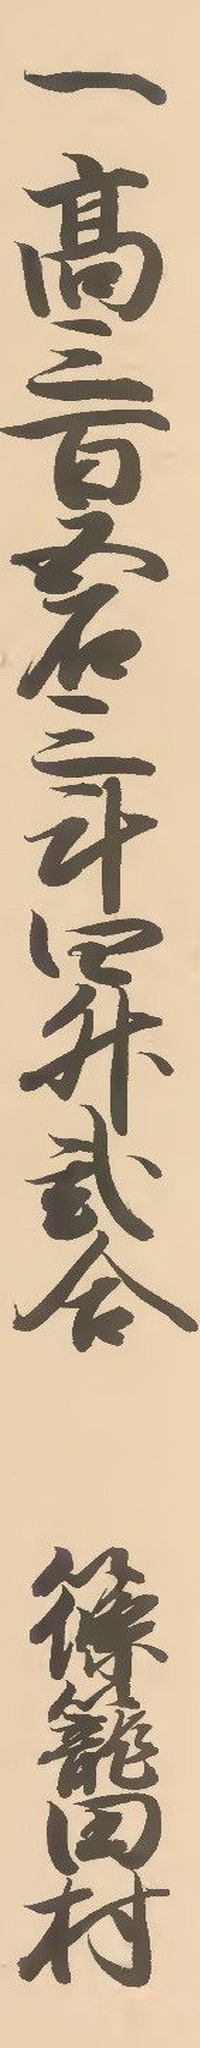一高三百五石三斗四升弐合篠籠田村
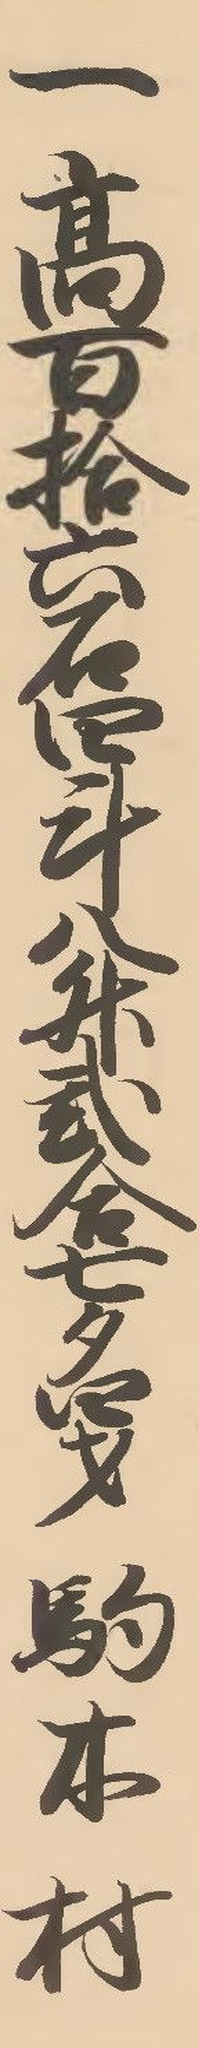一高百拾六石四斗八升弐合七勺四才駒木村
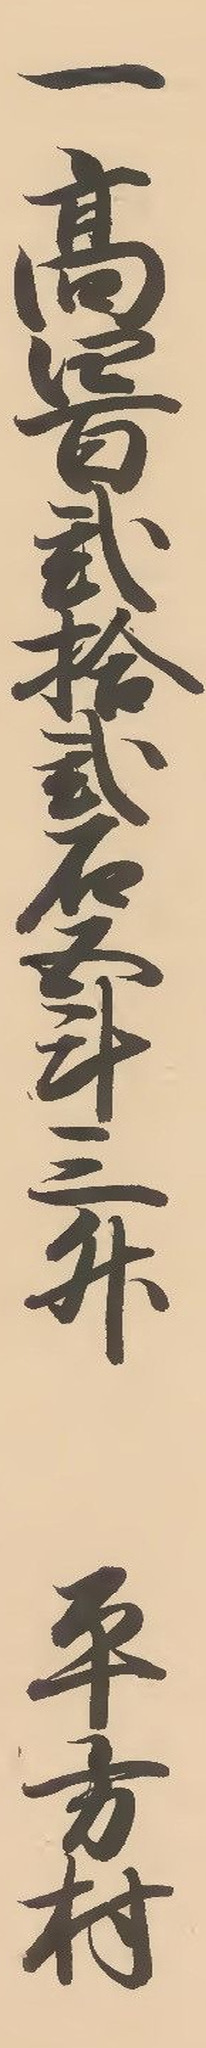一高四百弐拾弐石五斗三升平方村
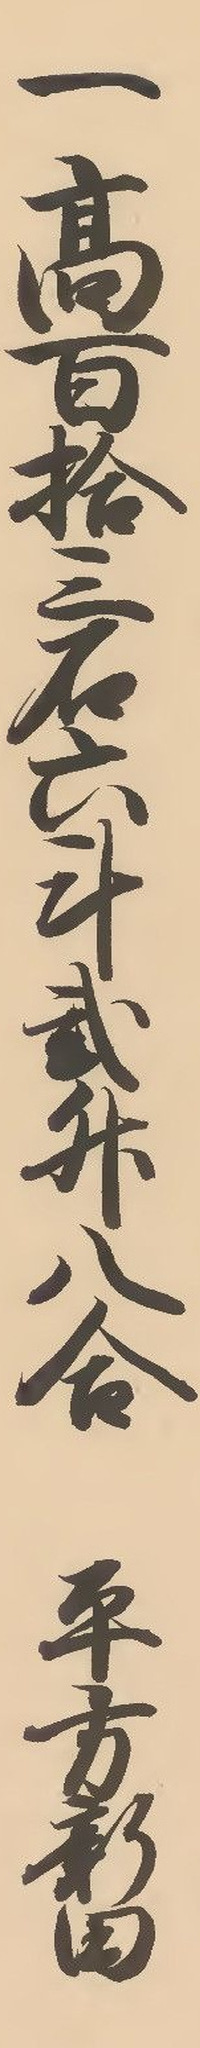一高百拾三石六斗弐升八合平方新田

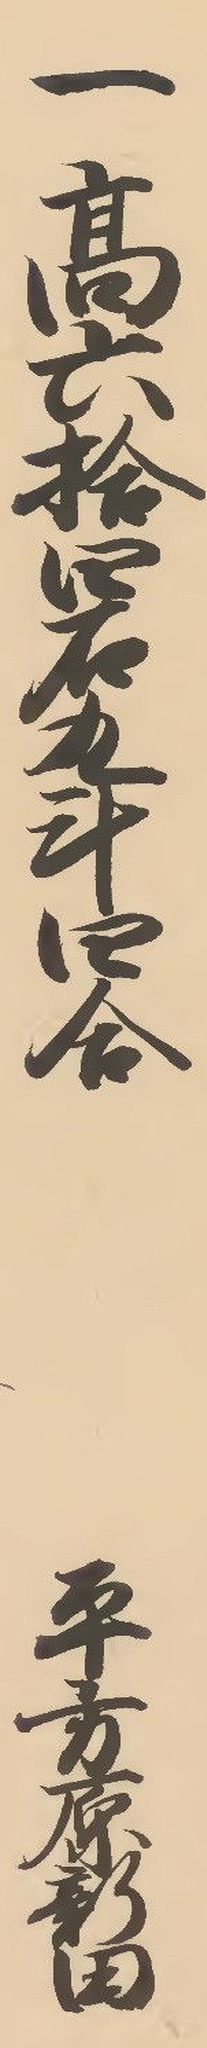一高六拾四石九斗四合平方原新田
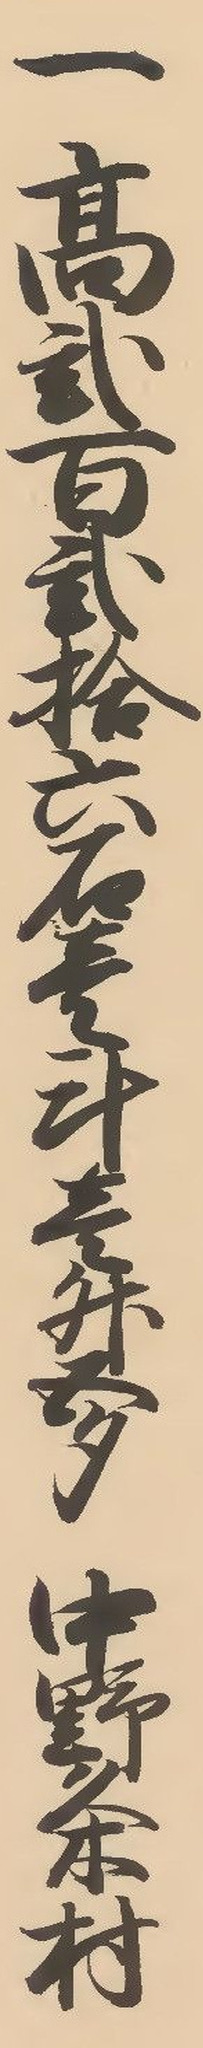一高弐百弐拾六石壱斗壱升五勺中野久木村
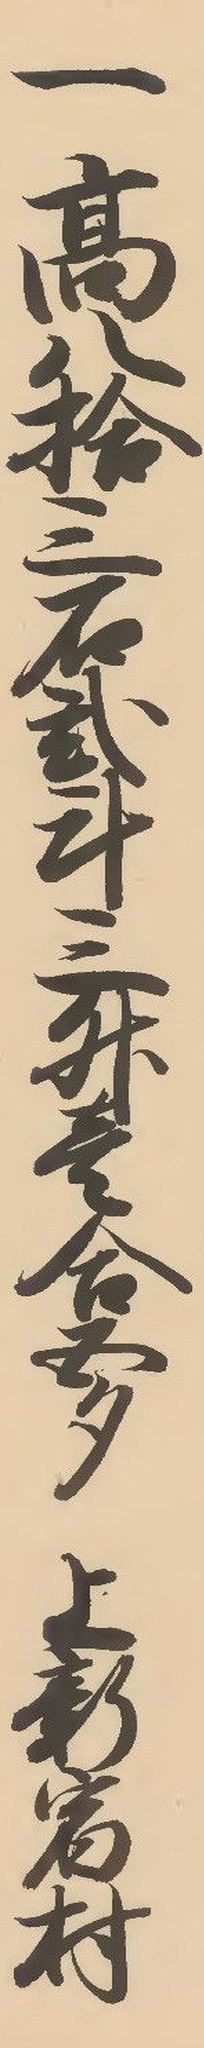一高八拾三石弐斗三升壱合五勺上新宿村
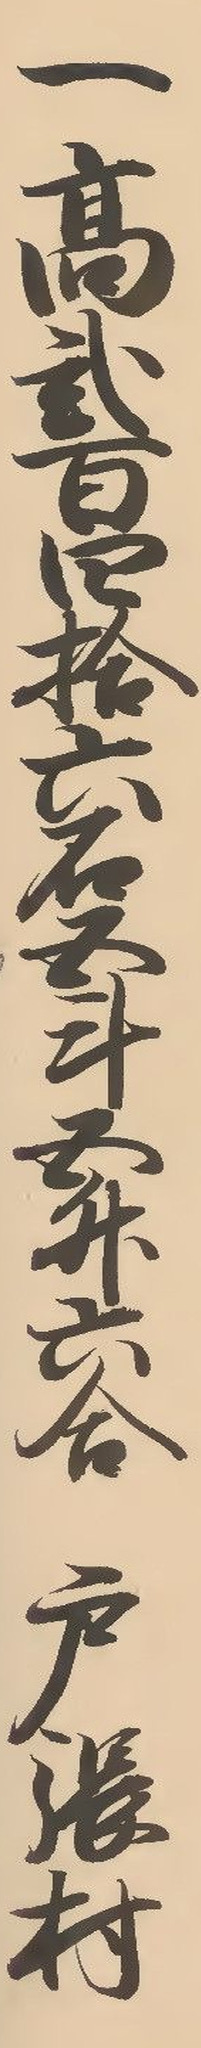一高弐百四拾六石五斗五升六合戸張村
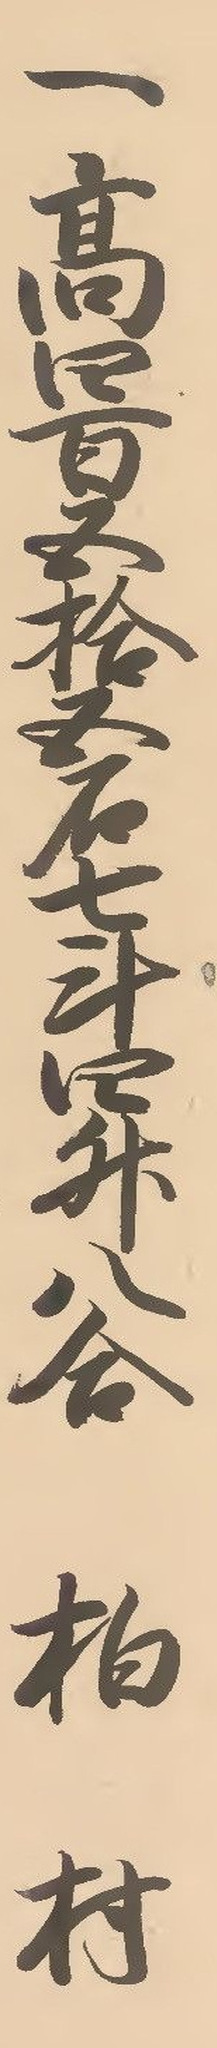一高四百五拾五石七斗四升八合柏村
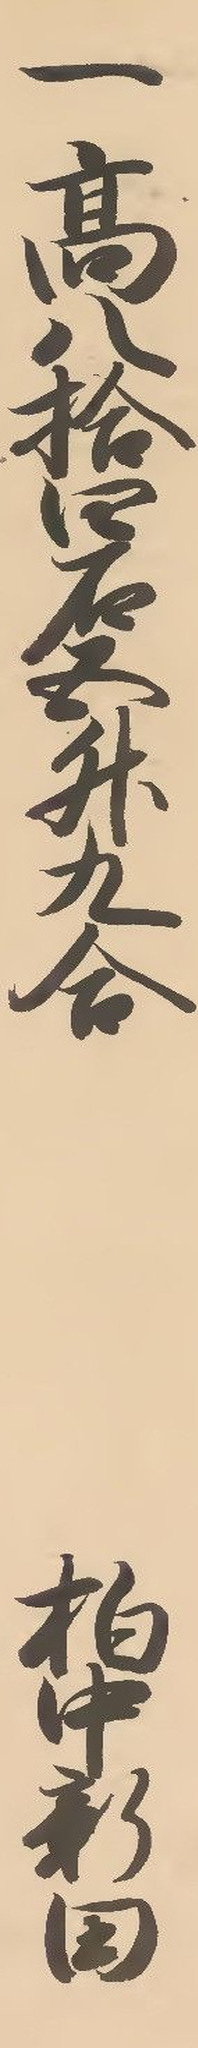一高八拾四石五升九合柏中新田
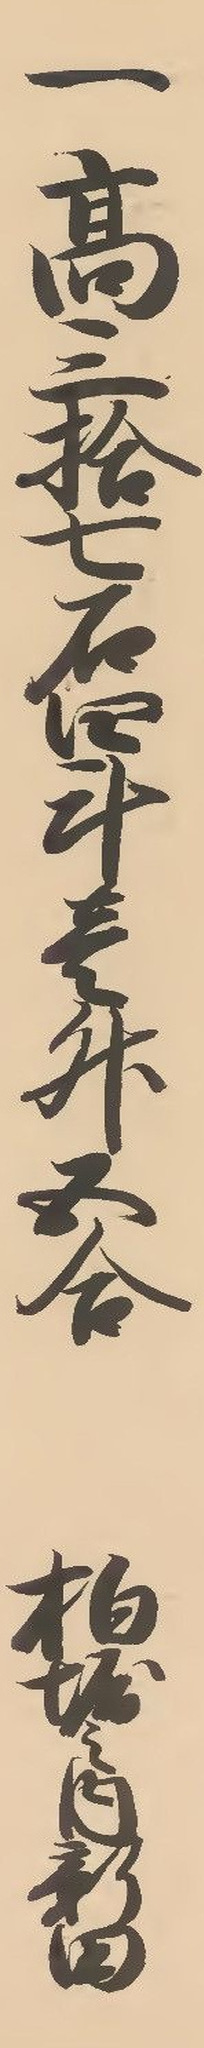一高三拾七石四斗壱升五合柏堀之内新田
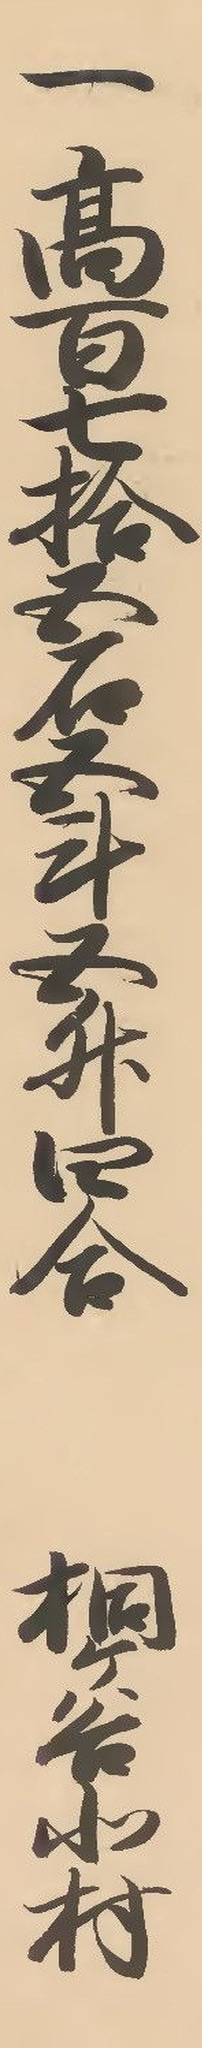一高百七拾五石五斗五升四合桐ヶ谷北村

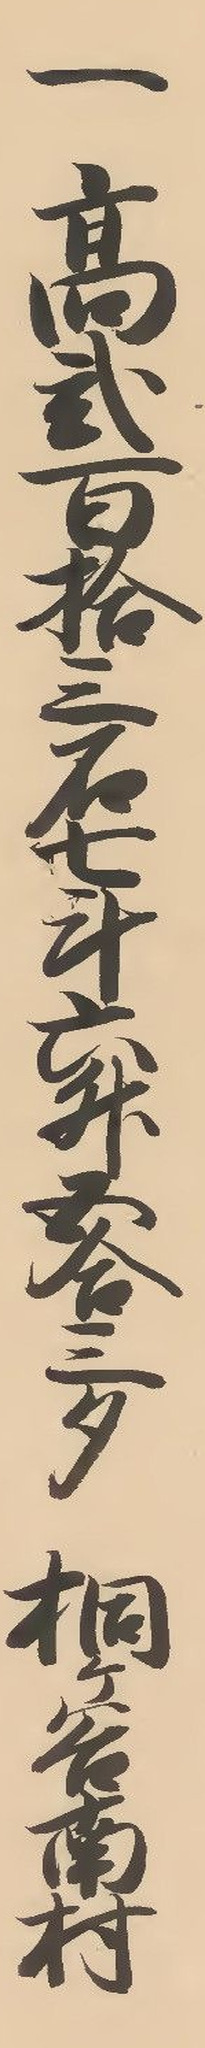一高弐百拾三石七斗六升五合三勺桐ヶ谷南村
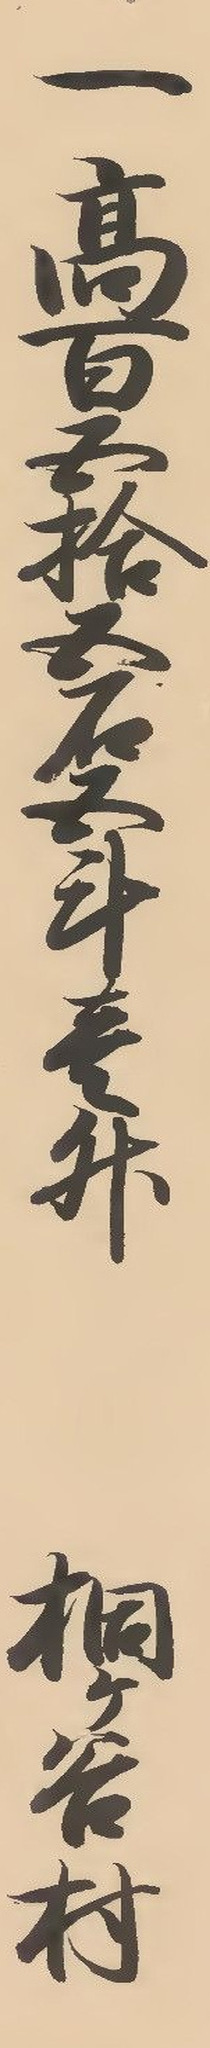一高百五拾五石五斗壱升桐ヶ谷村
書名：下総国郷帳
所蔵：国立公文書館 National Archives of Japan
